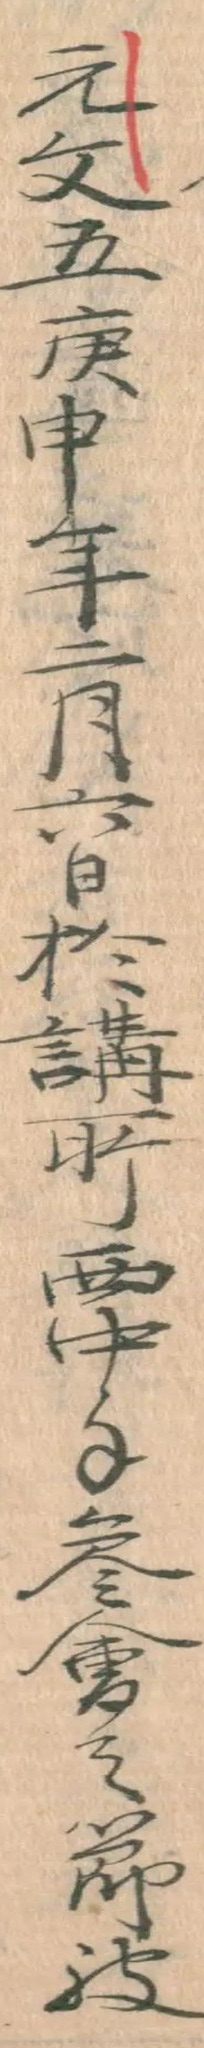元文五庚申年二月六日於講所西中手参會之節被
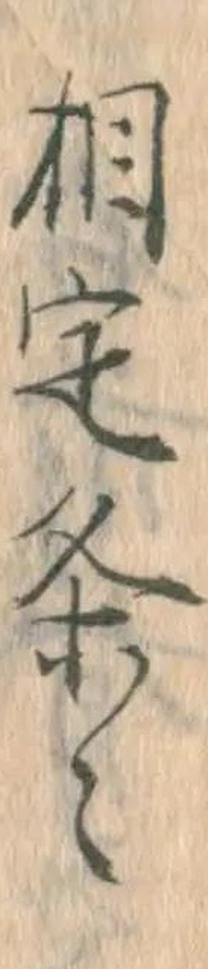相定条々
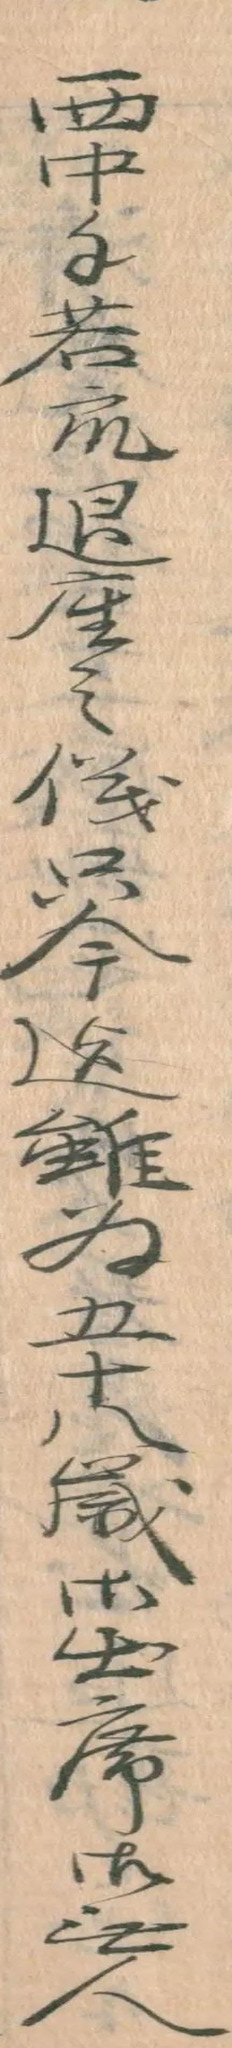一西中手若衆退座之儀只今迄雖為五十八歳御出席御無人
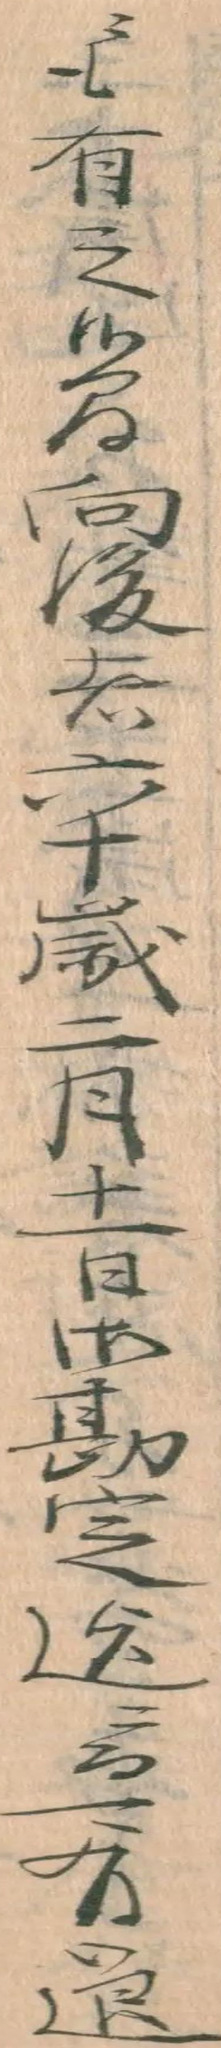ニも有之候間向後者六十歳二月十一日御勘定迄ニ而可有御退
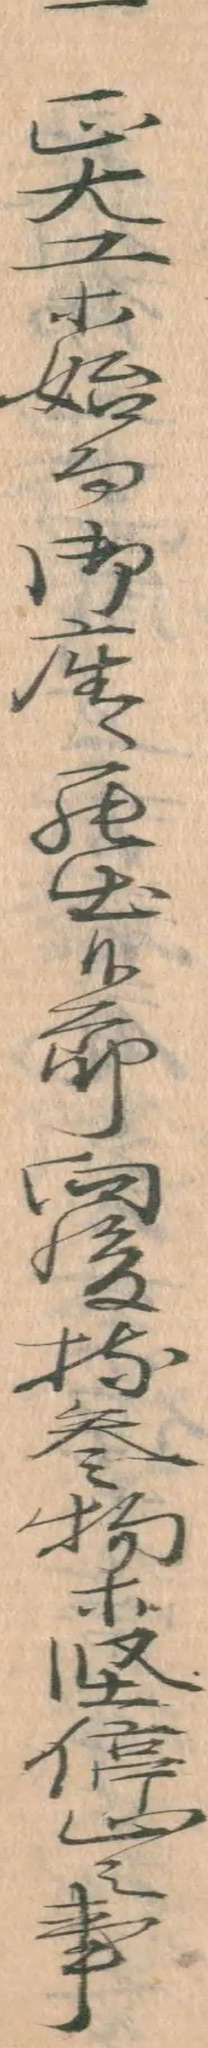一正大工等始而御座ヘ罷出候節向後持参物等堅停止之事
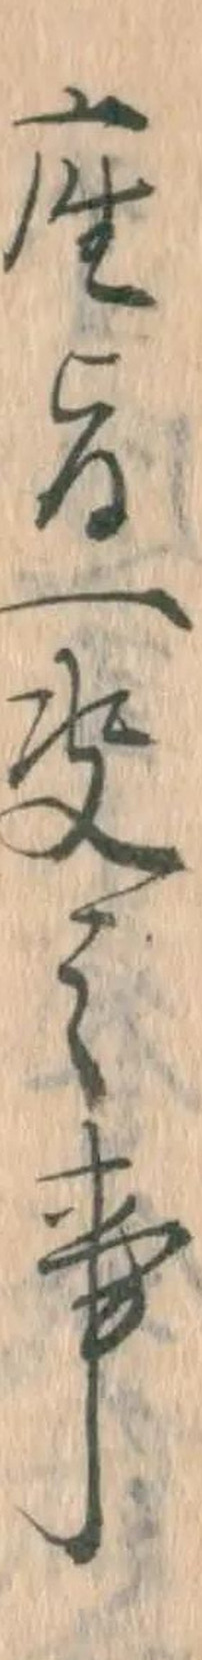座旨一決之事
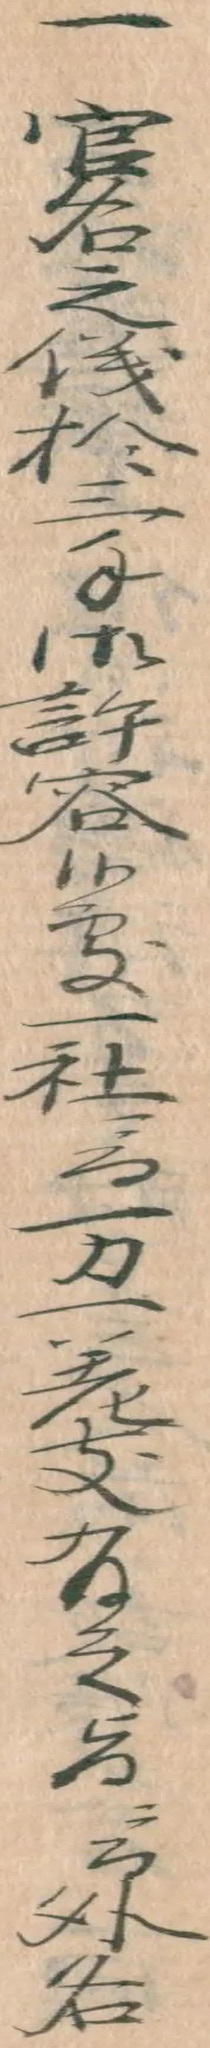一官名之儀於三手御許容候處一社二而万一差支有之旨ニ而外名
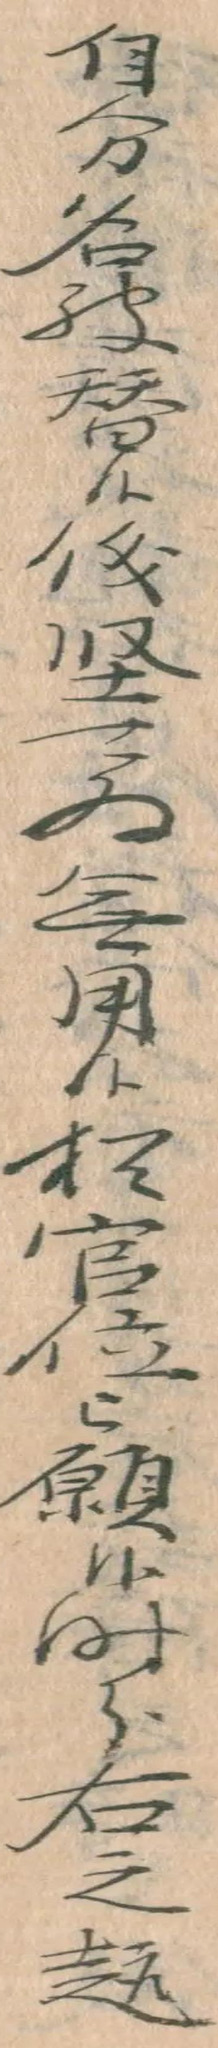自分名被替候儀堅可為無用候猶官位被願候時分右之趣
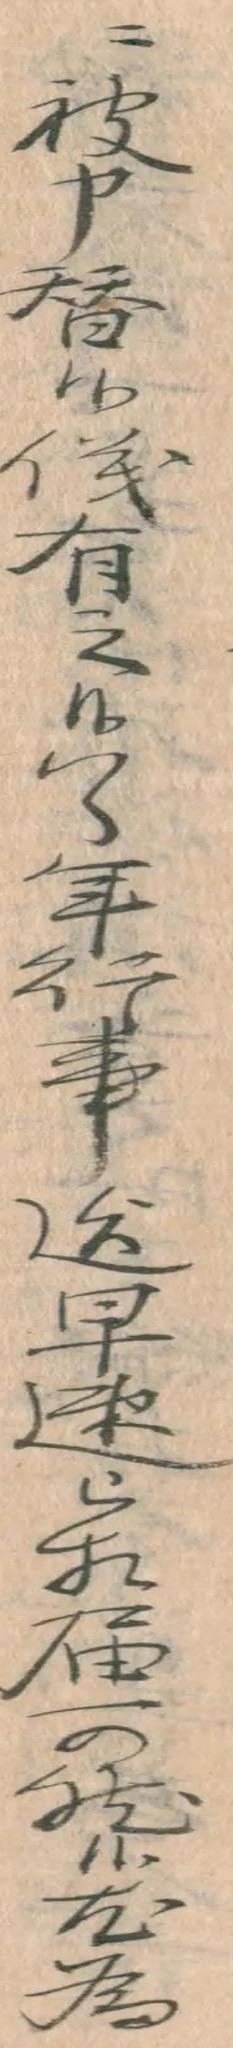ニ被申替候儀有之候ハヽ年行事迄早速被相届可然候尤為
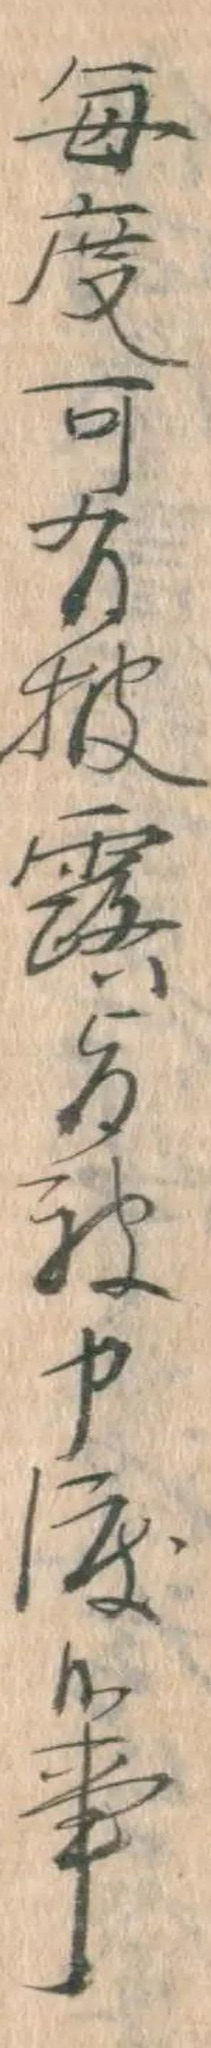毎度可有披露旨被申渡候事
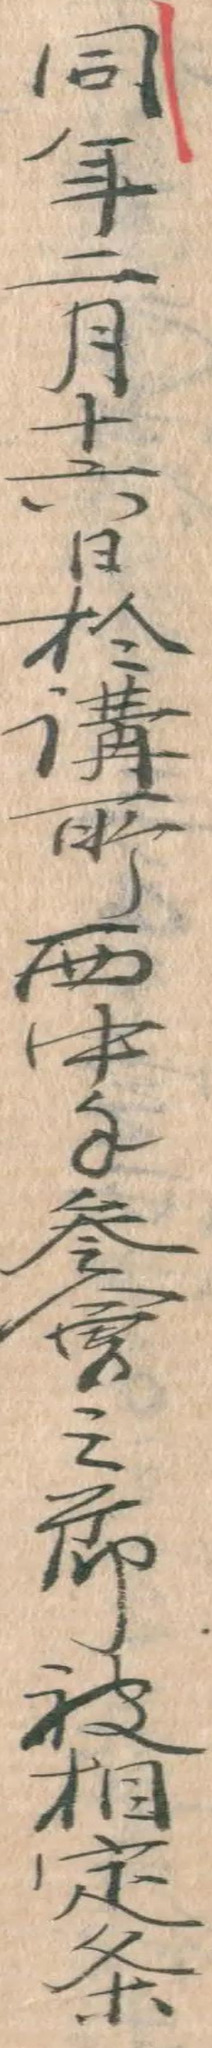同年二月十六日於講所西中手参會之節被相定条
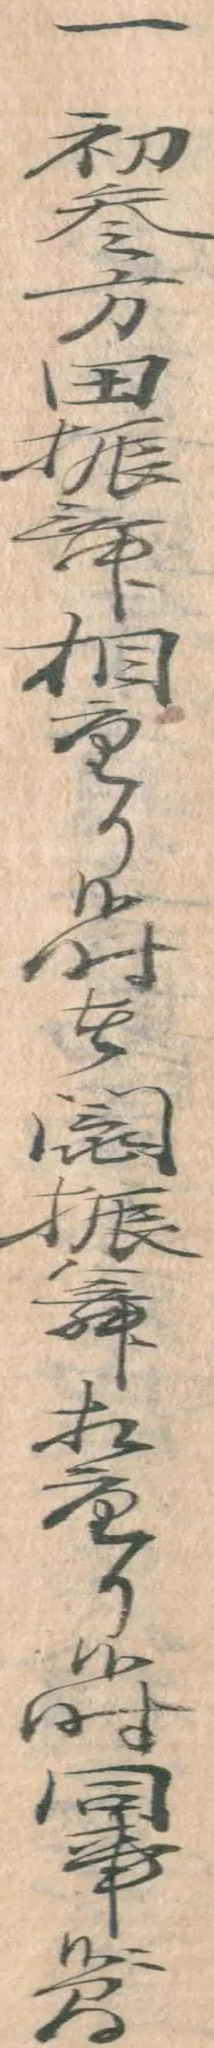一初参方田振舞相重り候時者鬮振舞相重なり候時同事ニ候間
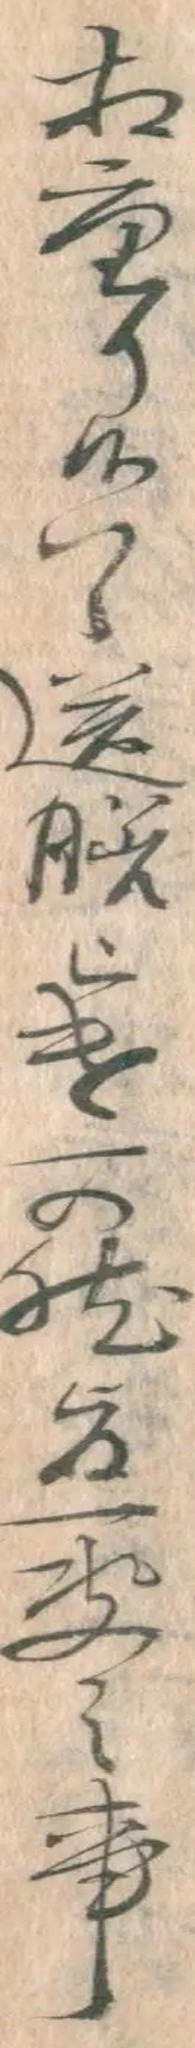相重り候ハヽ送膳被遣可然旨一決之事
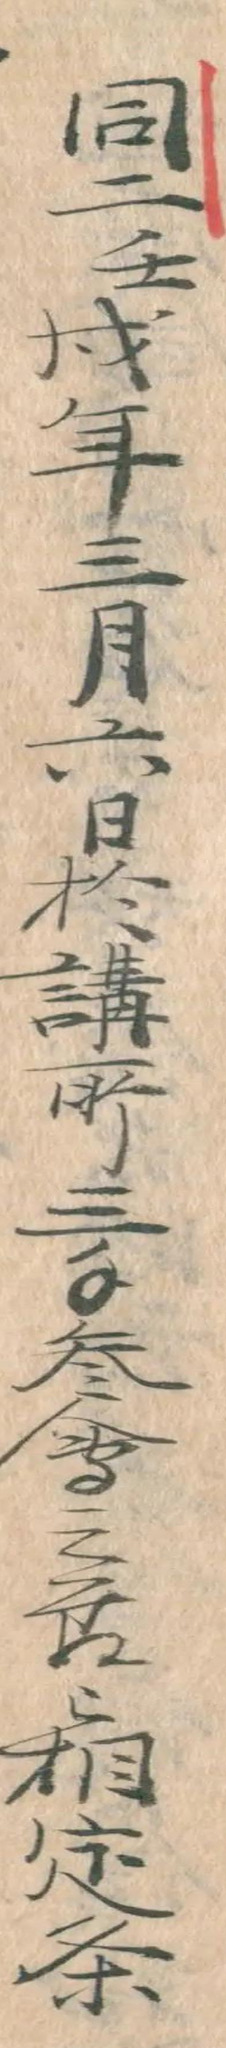同二壬戌年三月六日於講所三手参會之節被相定条
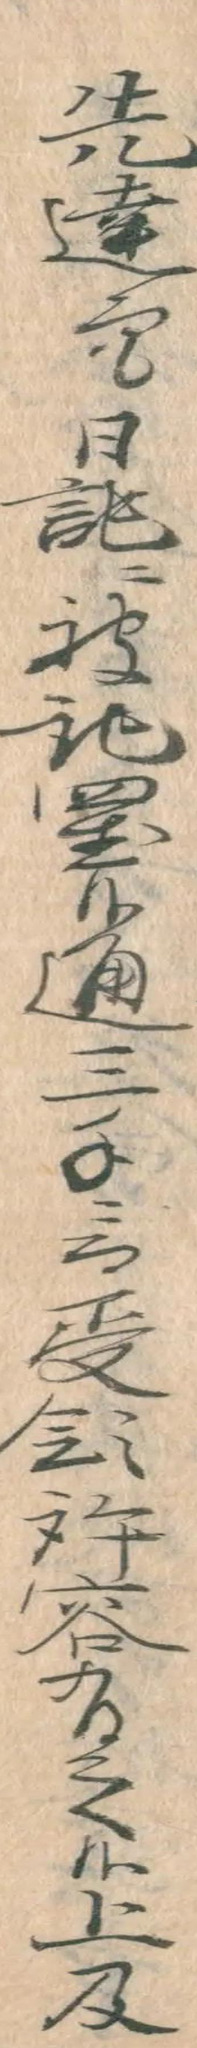一先達而も日記ニ被記置候通三手ニ而受領許容有之候上及
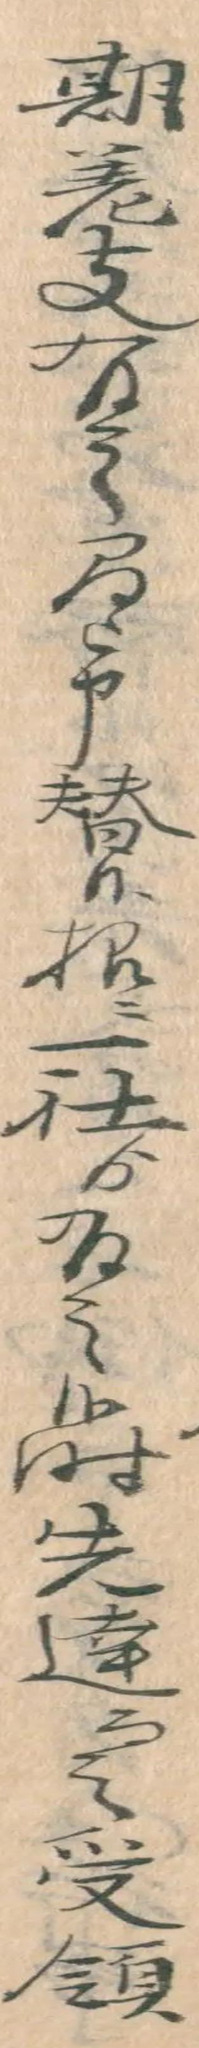期差支有之間被申替候様ニ一社ゟ有之候時先達而之受領
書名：賀茂社記録. 第29冊
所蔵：国立国会図書館 National Diet Library, JAPAN
